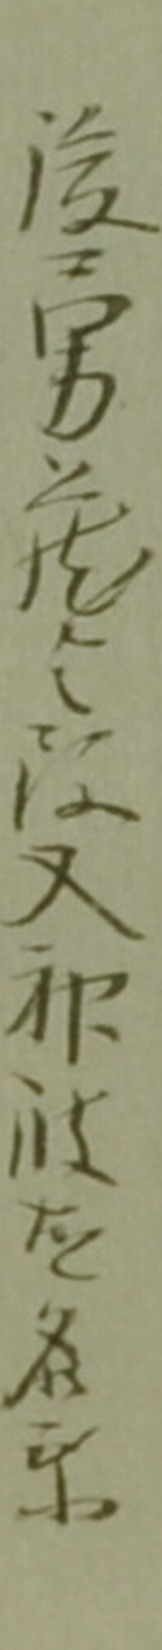後勇蔵と改又神波を名乗
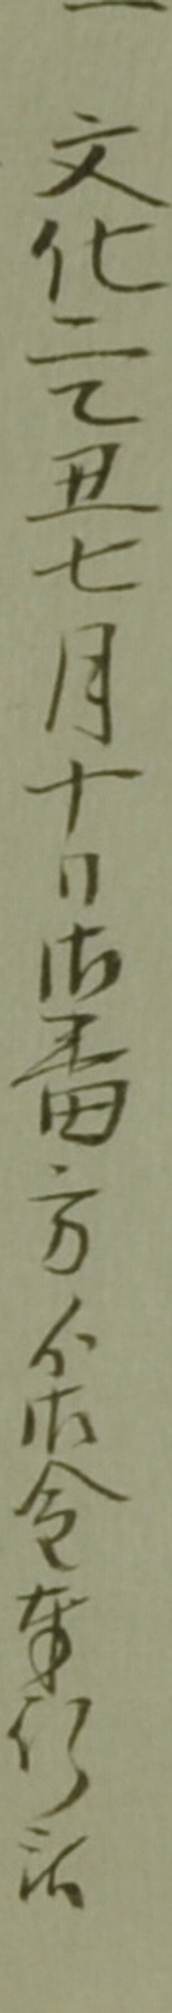一文化二乙丑七月十日御番方ゟ御金奉行被
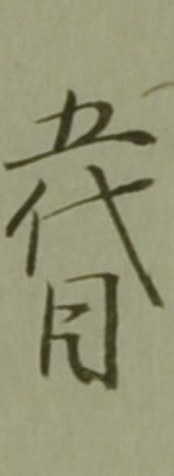五代目
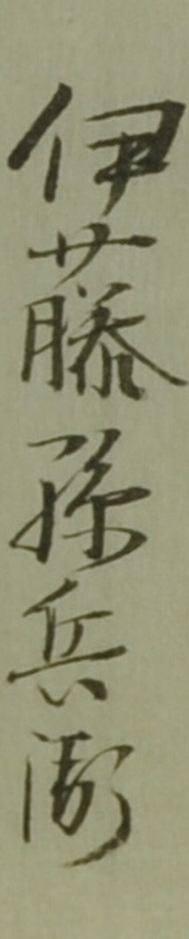伊藤孫兵衛
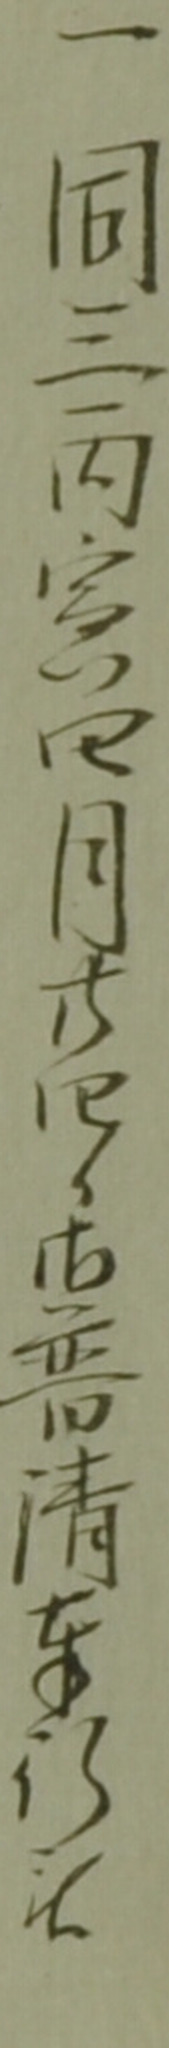一同三丙寅四月廿四日御普請奉行被
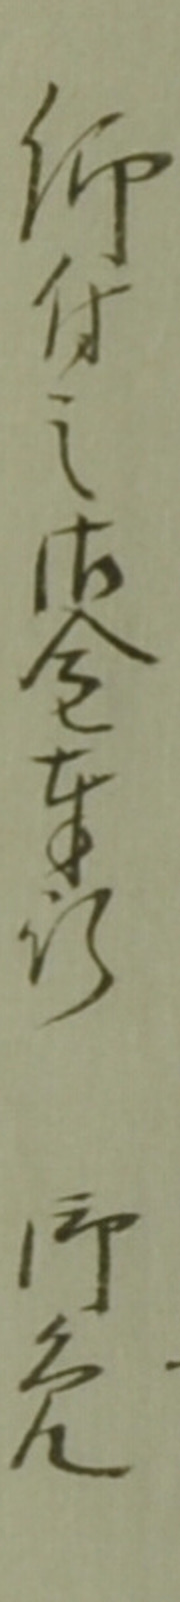仰付之御金奉行御免
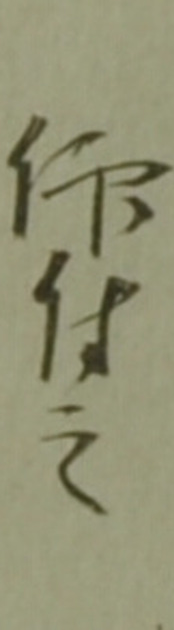仰付之

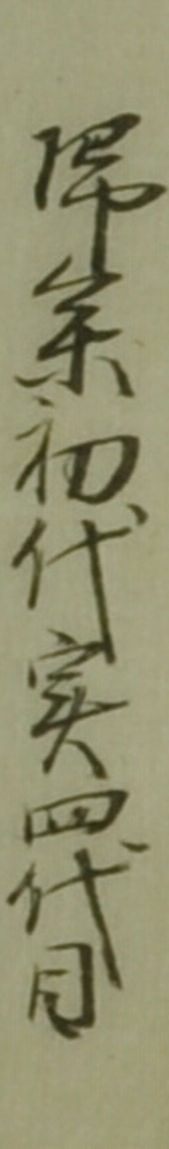帰参初代実四代目
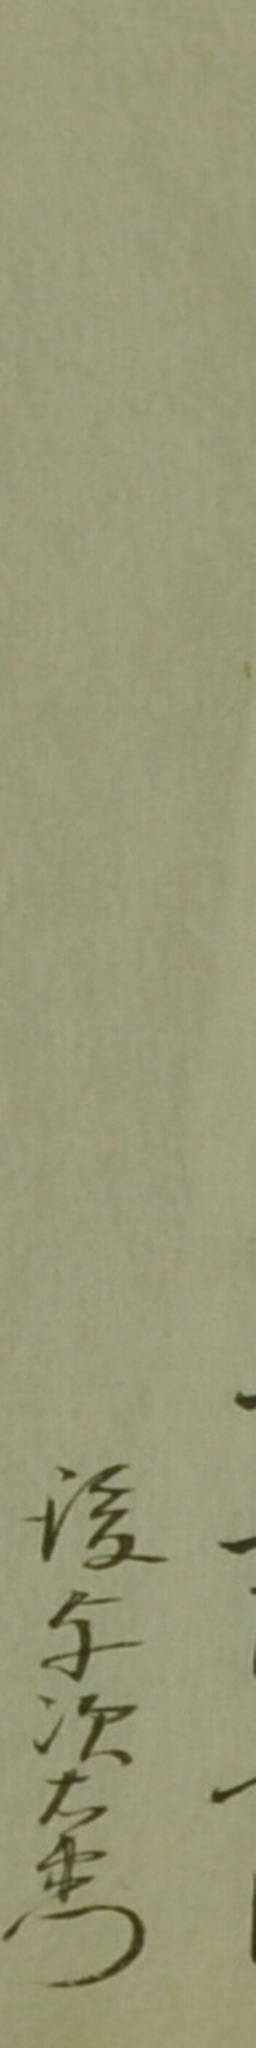後与次右衛門
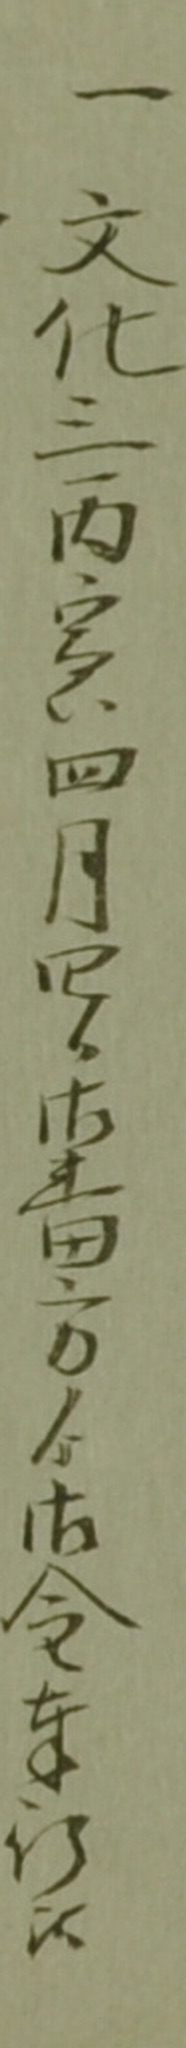一文化三丙寅四月四日御番方ゟ御金奉行被
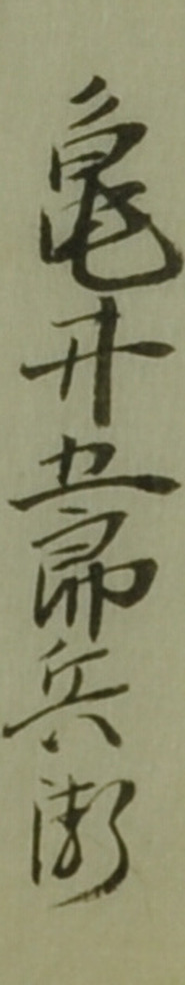亀井五郎兵衛
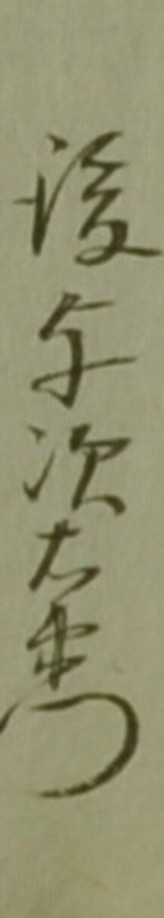後与次右衛門
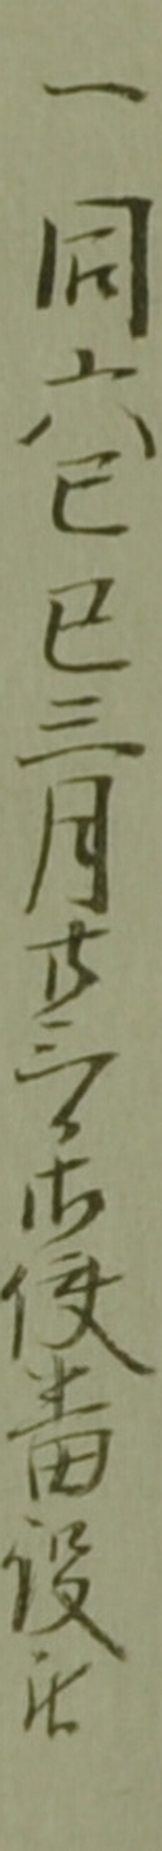一同六己巳三月廿三日御使番役被
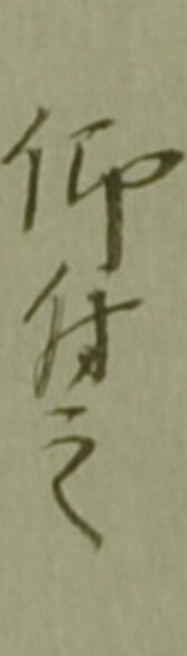仰付之
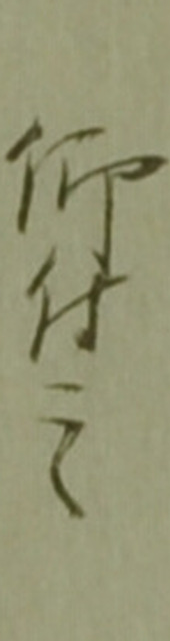仰付之
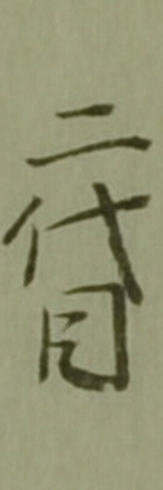二代目
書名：諸御役代々録（七）
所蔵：伊那市立高遠町図書館・合同会社AMANE
